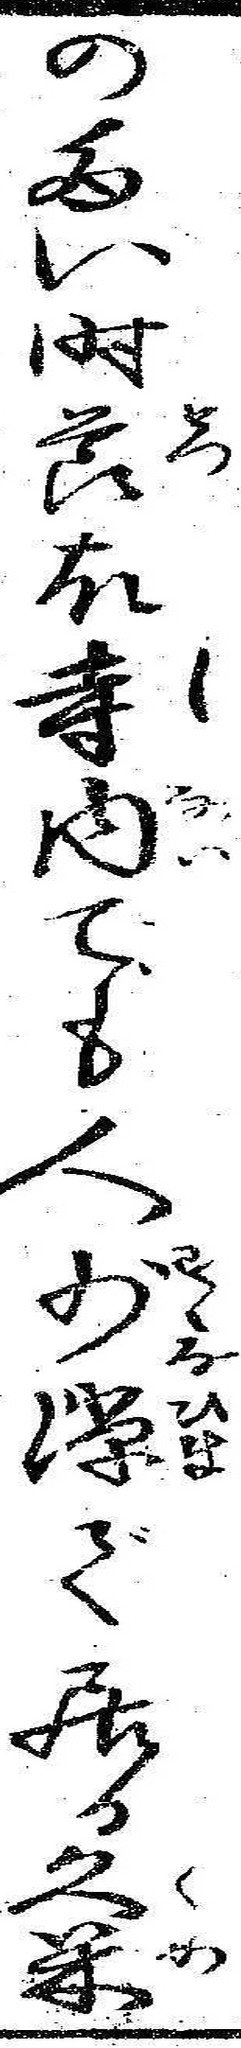の多い時節故寺内ても人少隙で居る久米
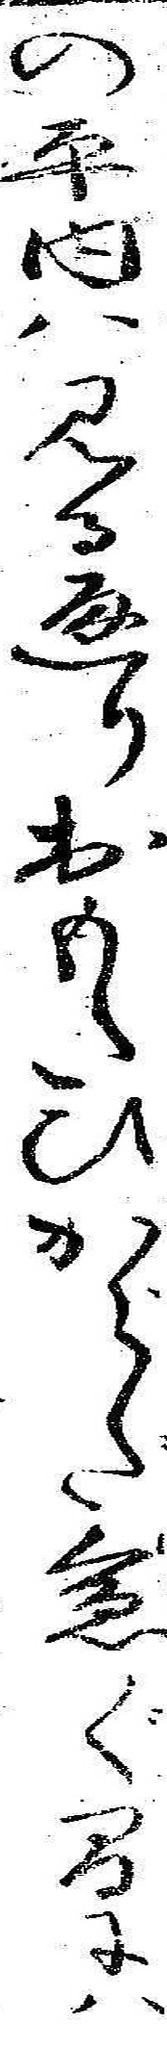の平内は見る通りおもたいからだ急ぐ間には
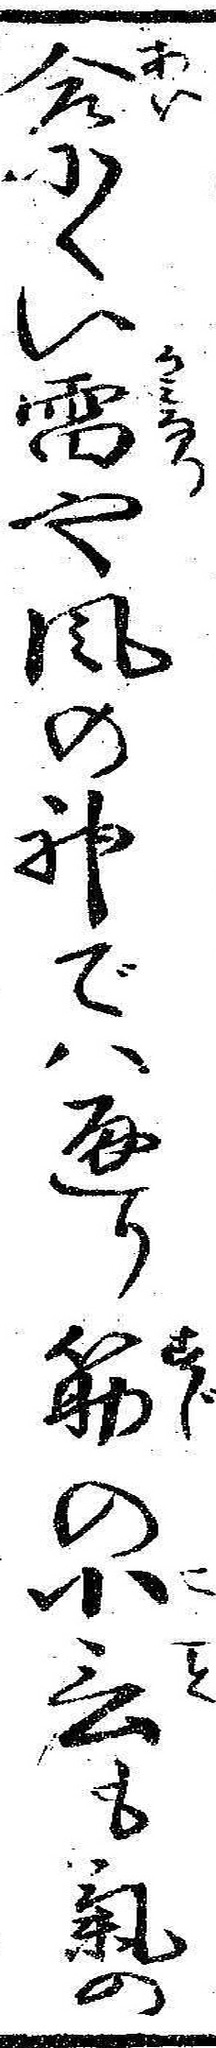合にくい雷や風の神では通り筋の小言も気の
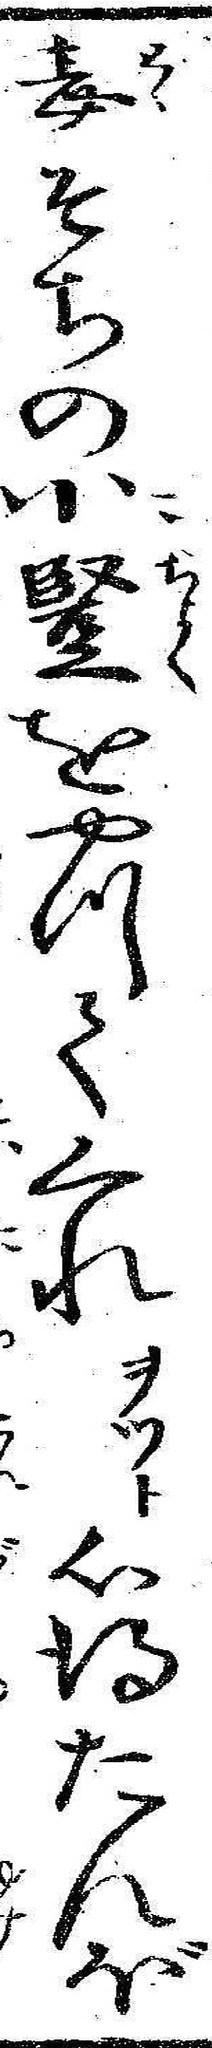毒そちの小豎をやつてくれ心得たんぼ
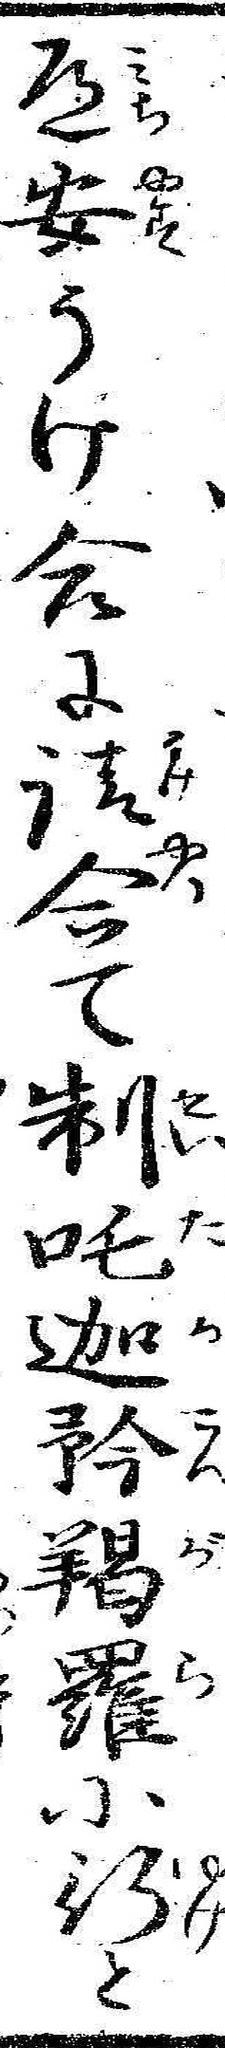道安うけ合に請合て制叱迦衿朔羅に行と
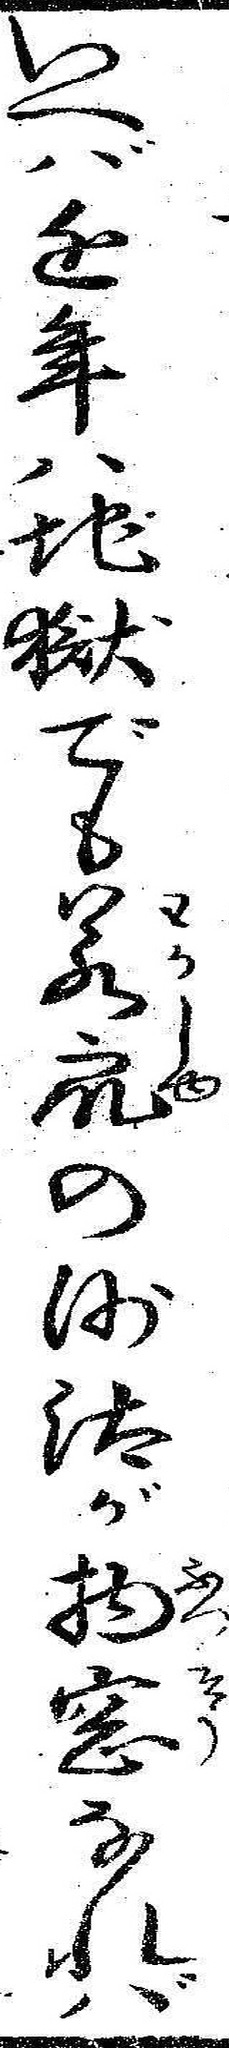いへば近年は地獄でも若衆の沙汰が物窓なれば
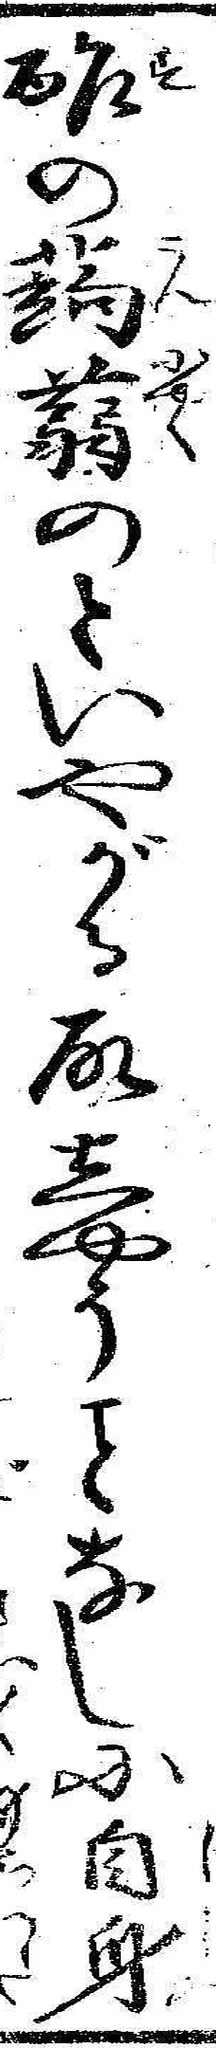酢の蒟蒻のといやがる故しやうことなしに自身
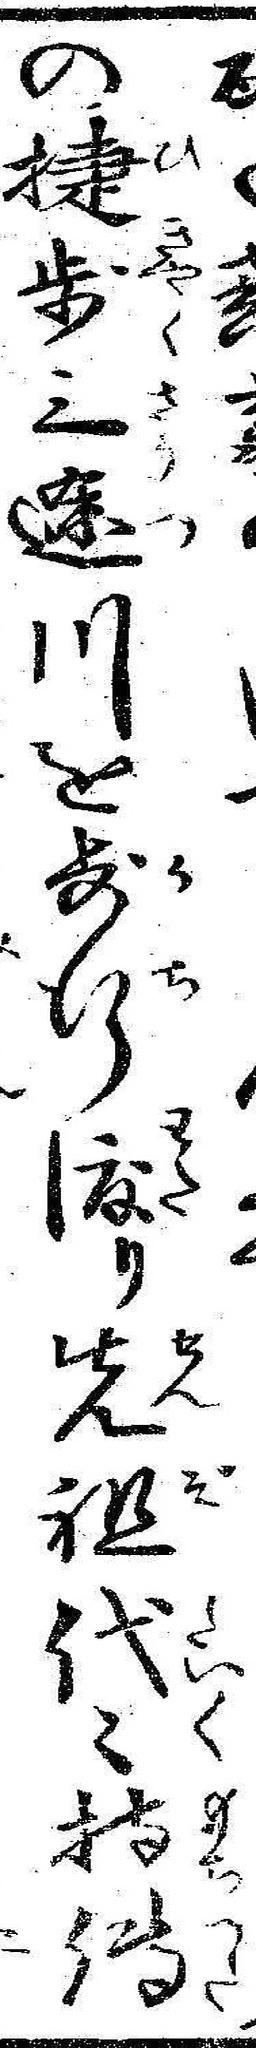の捷歩三途川を歩行渡り先祖代々持伝
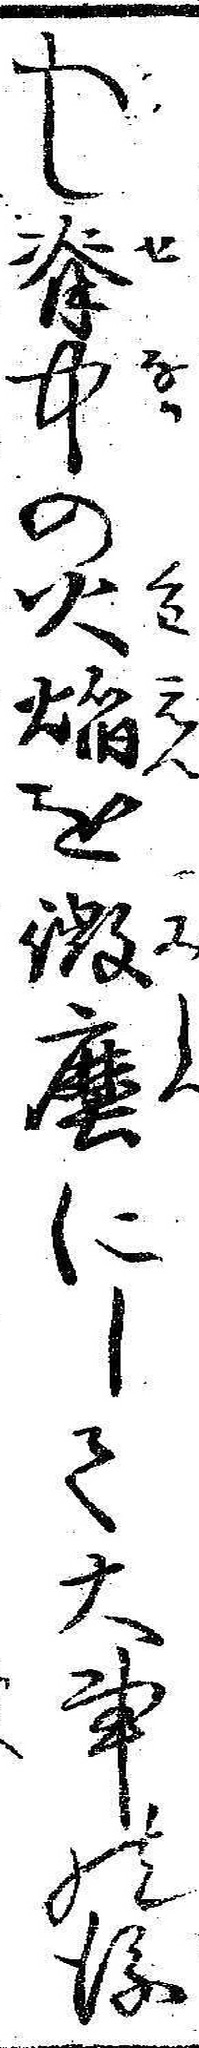へし脊中の火焔を微塵にして大事の後
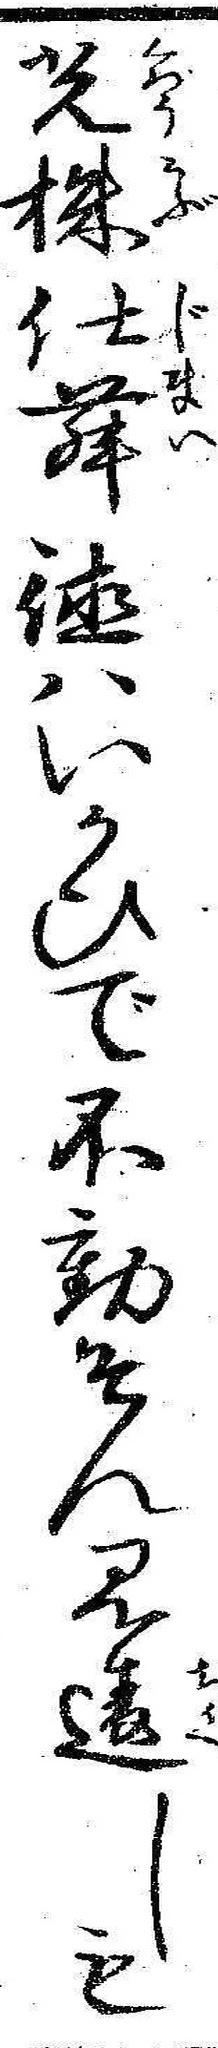光株仕舞徳はいかひで不動そん見違しも
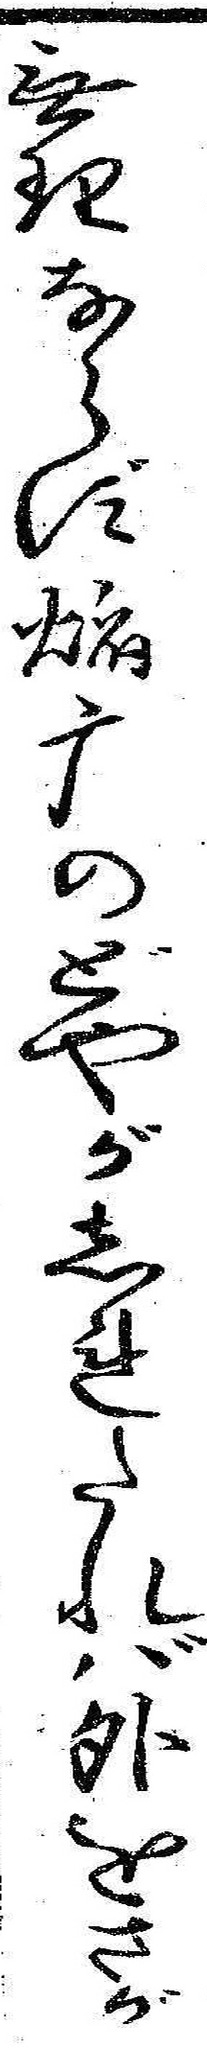無理ならず焰魔のどやがしれたれば外をさが

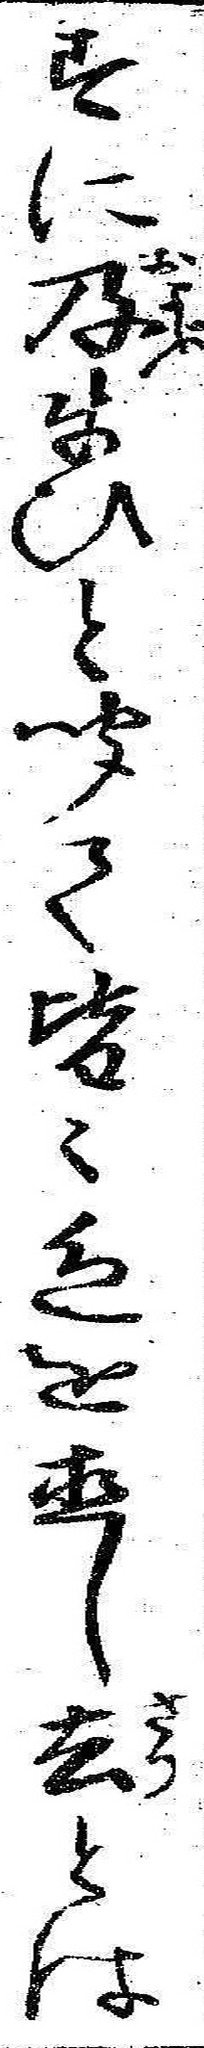すに及まひと聞て皆々色を直し去とは
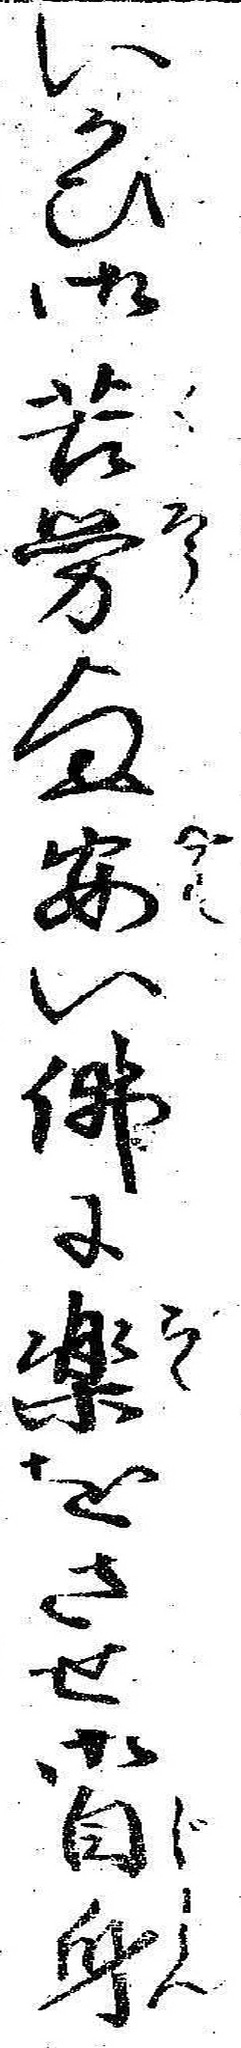いかひ御苦労様安い仏に楽をさせ御自身
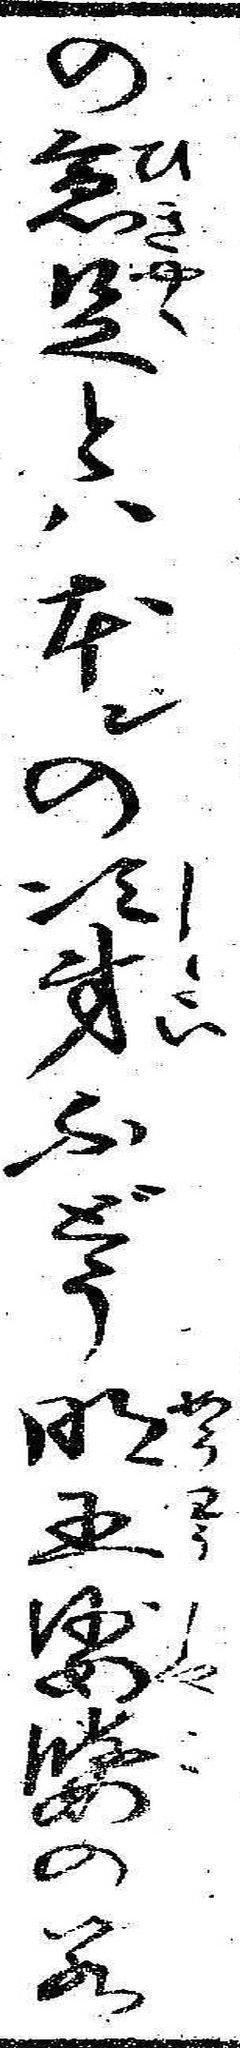の急足とは本次第ふどう明王娑婆の若
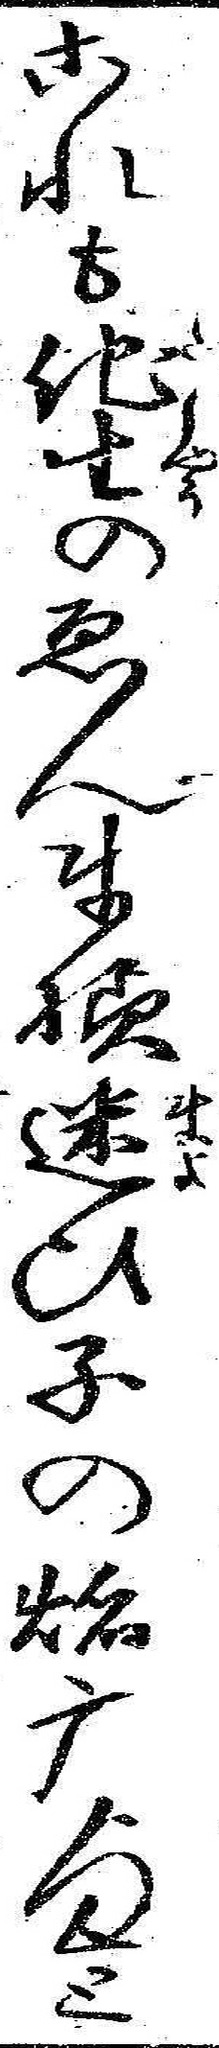これも他生のゑんま様迷ひ子の焔魔様と
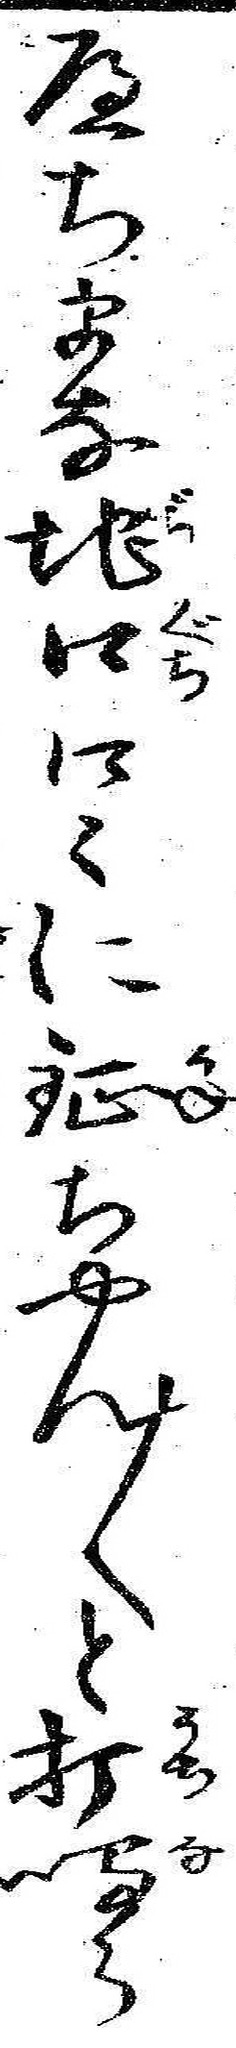へちまな地口口々に鉦ちやん〱と打鳴ら
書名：根無草後編
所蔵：国文学研究資料館
